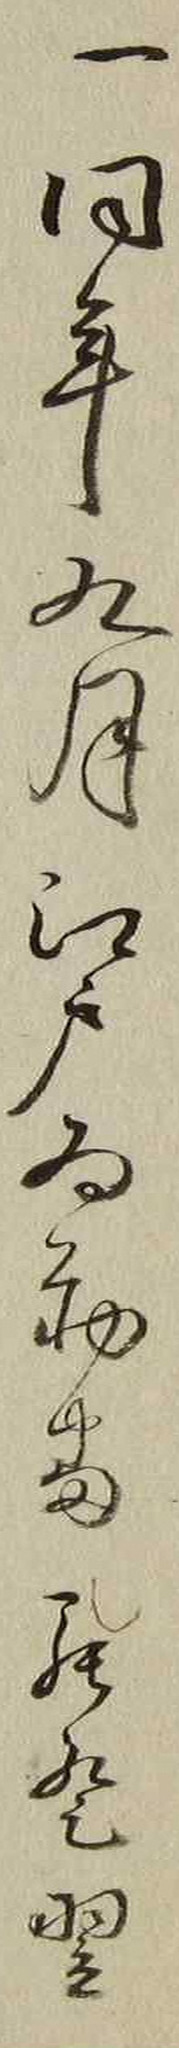一同年九月江戸為勤番罷登翌
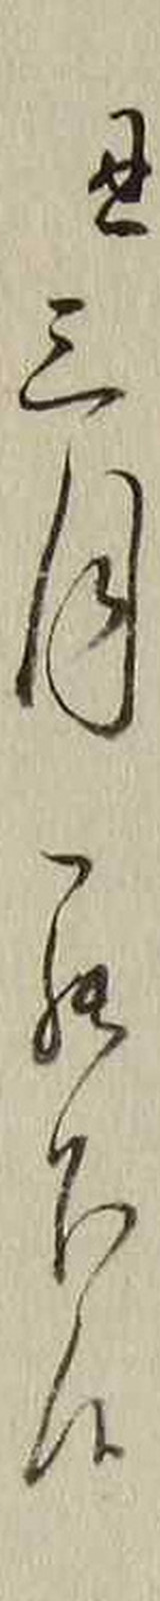丑三月罷下候
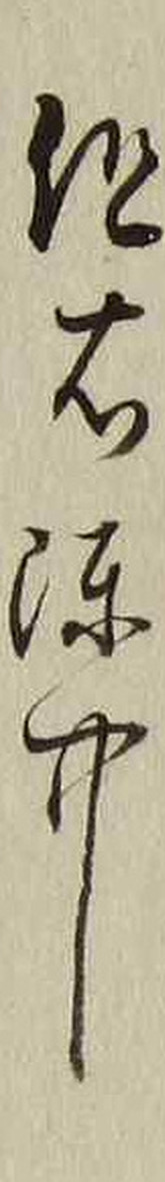但右陣中
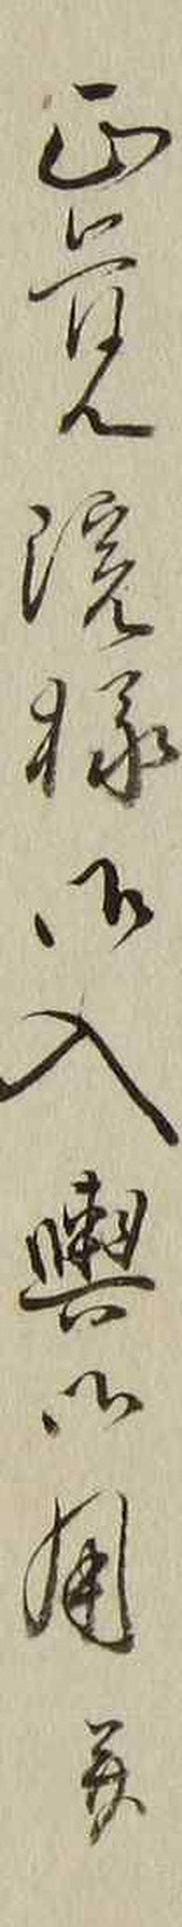正覚院様御入輿御用并
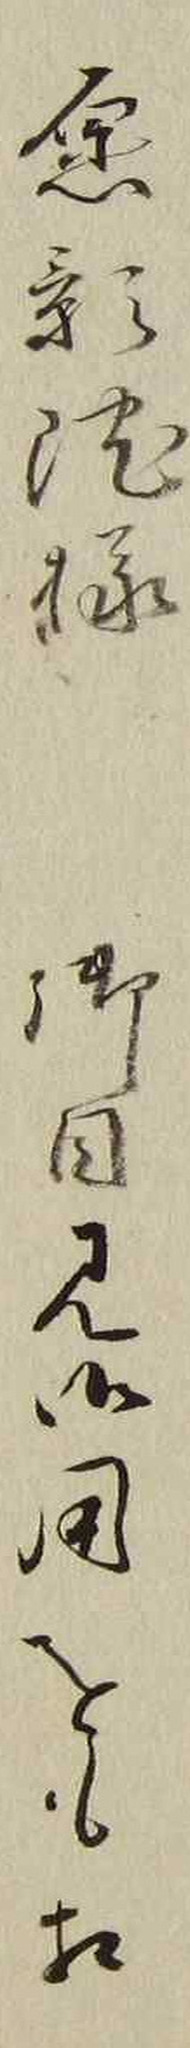愿彰院様御目見御用をも相
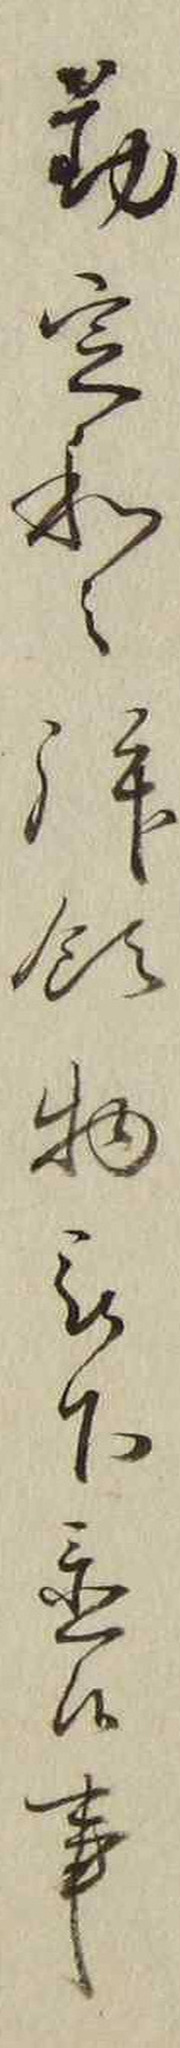勤定和之拝領物被下置候事

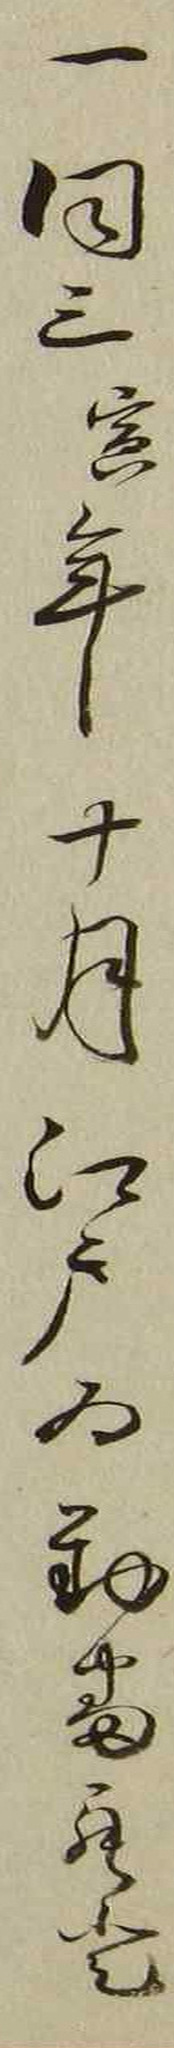一同三寅年十月江戸為勤番罷登
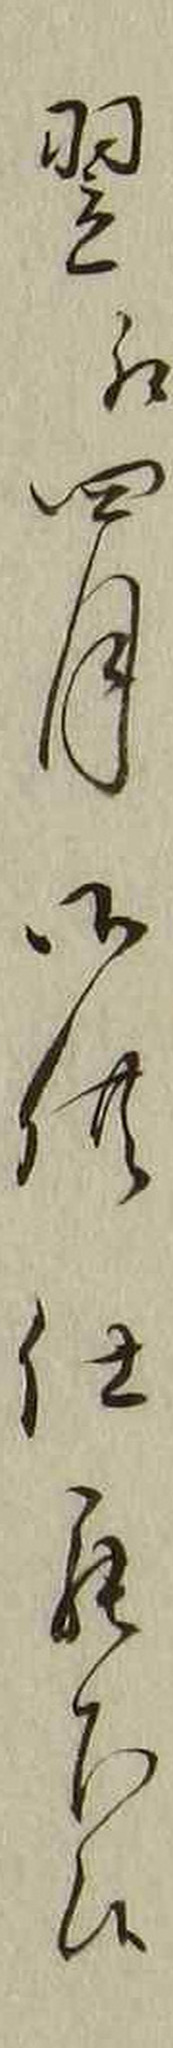翌卯四月御供仕罷下候
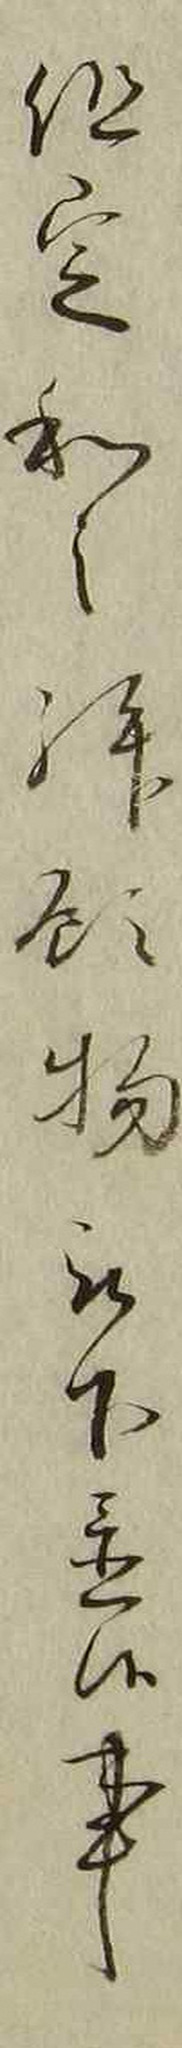但定和之拝領物被下置候事
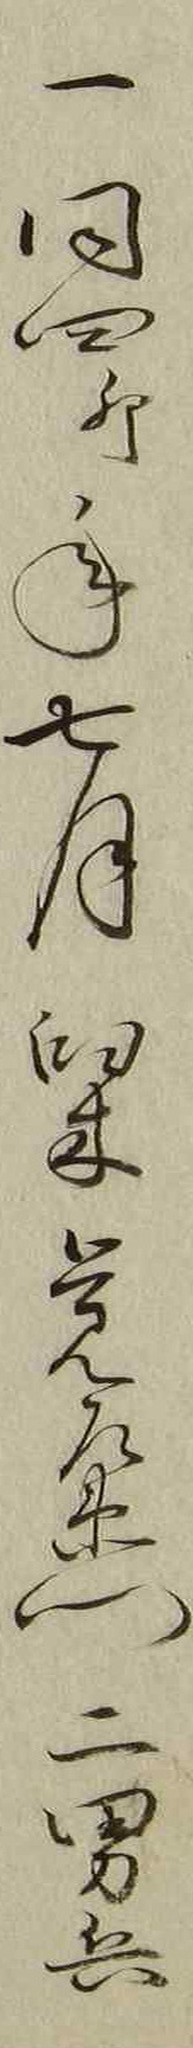一同四卯年七月臼木覚左衛門二男兵
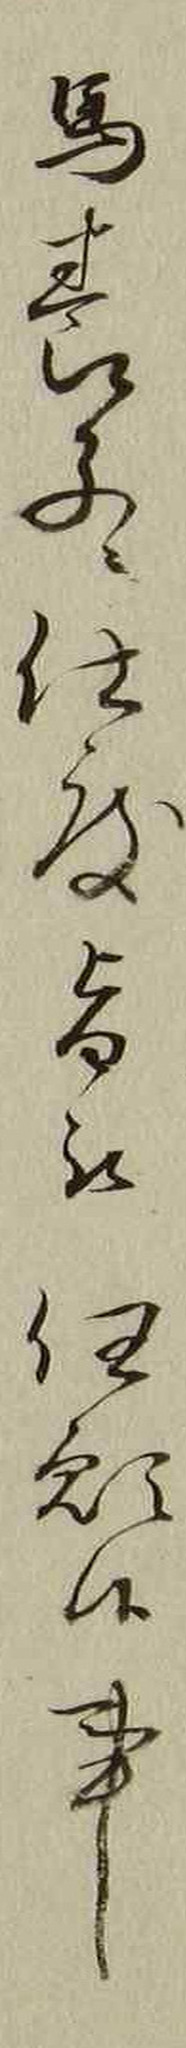馬養子ニ仕度旨被任願候事
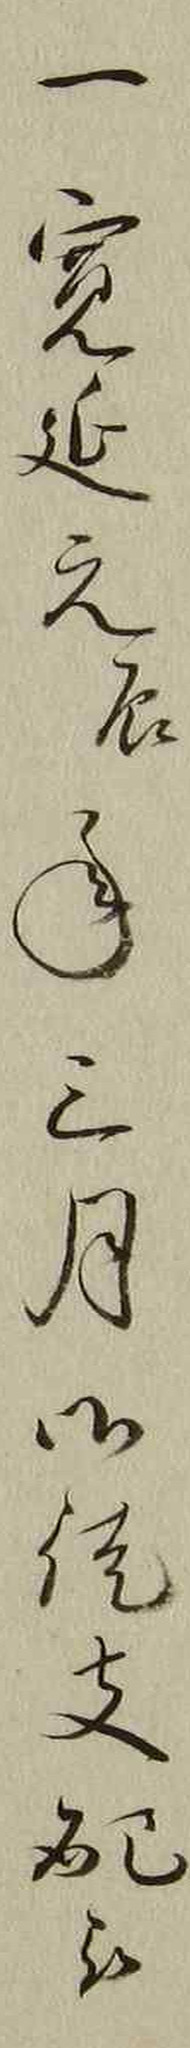一寛延元辰年三月御徒支配被
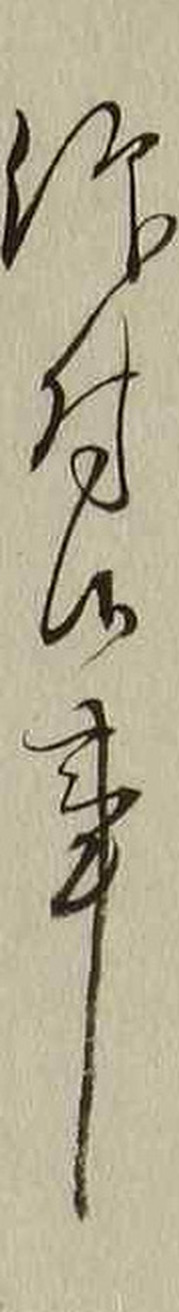仰付候事
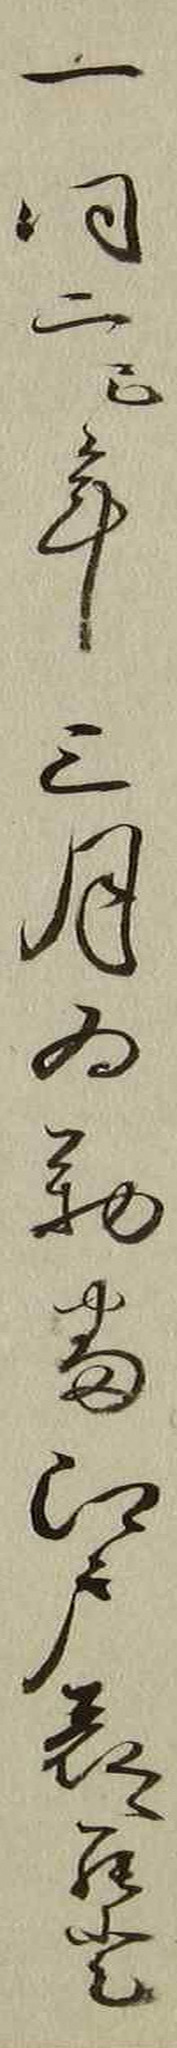一同二巳年三月為勤番江戸表へ罷登
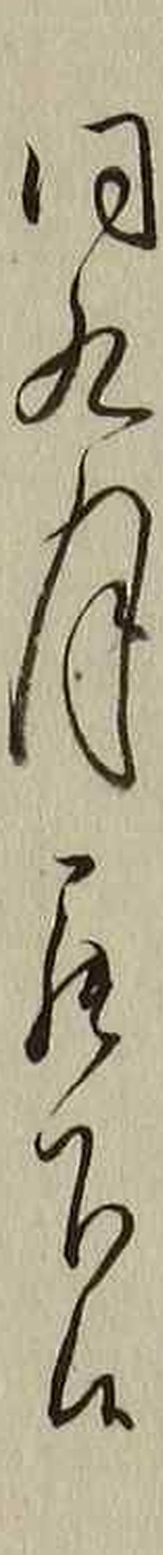同九月罷下候
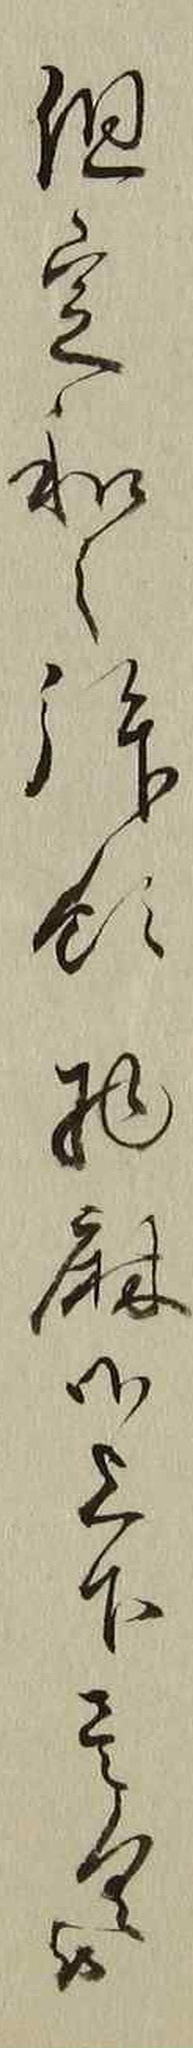但定和之は拝領物麻御上下壱具被
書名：諸士系譜　巻之2　い之部2
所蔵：会津若松市立会津図書館
